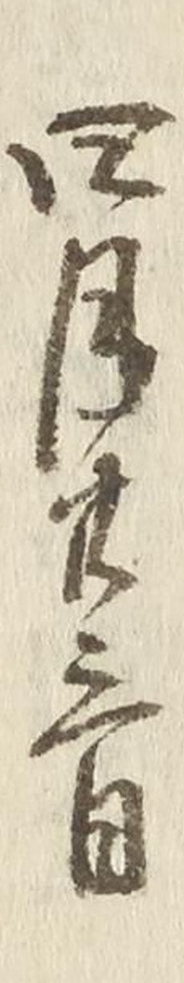四月廿三日
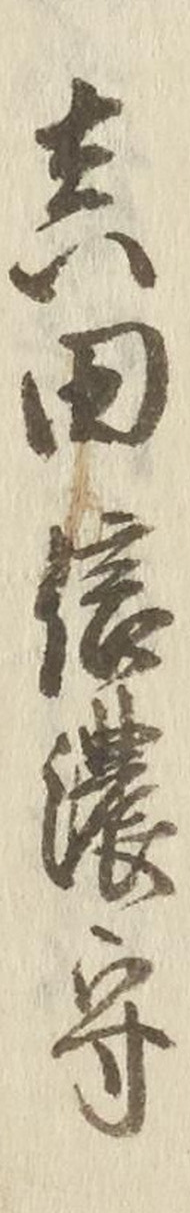真田信濃守
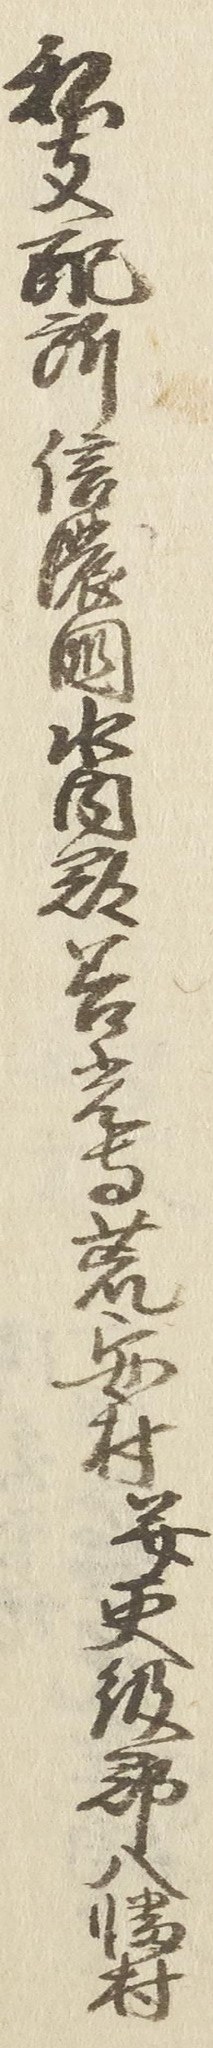私支配所信濃国水内郡善光寺荒安村并更級郡八幡村
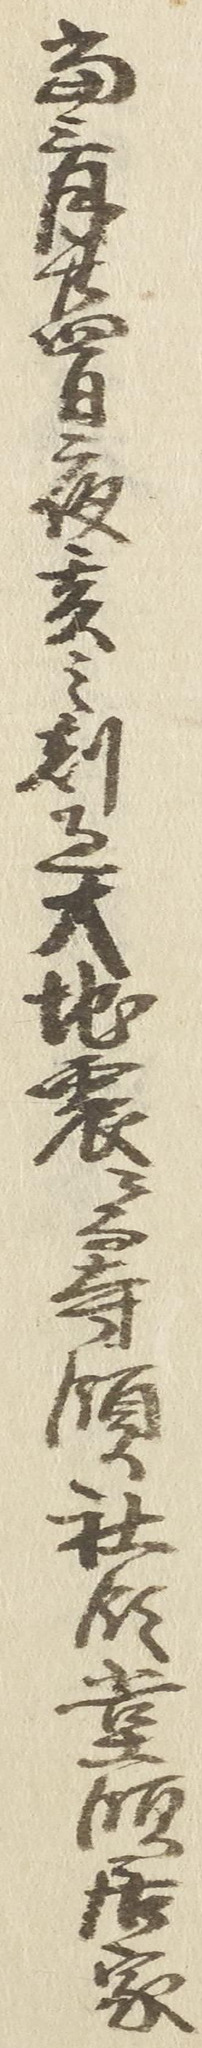当三月廿四日夜亥之刻過大地震二而寺領社領堂領居家

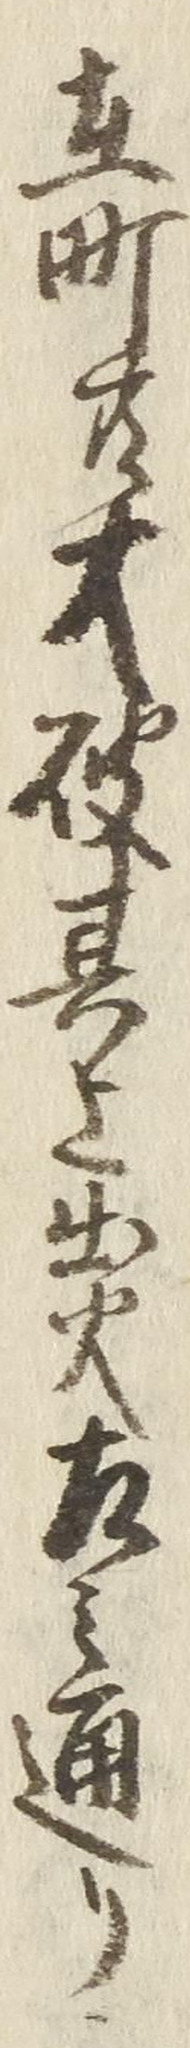在町共大破其上出火左之通
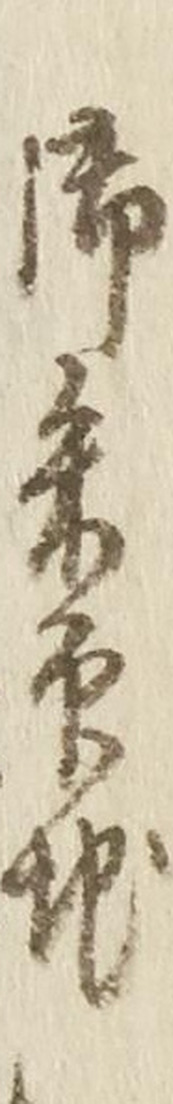御朱印地
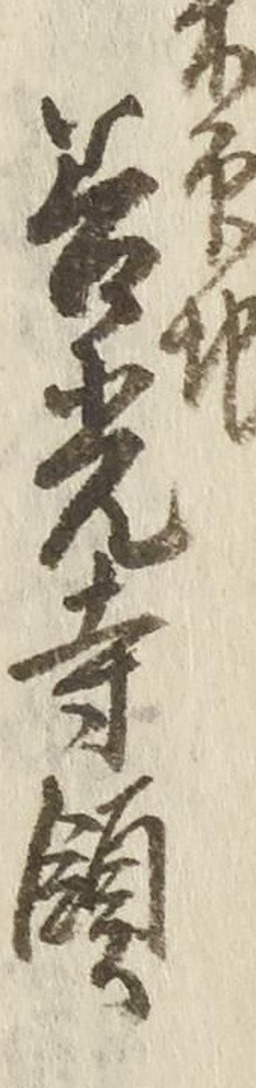善光寺領
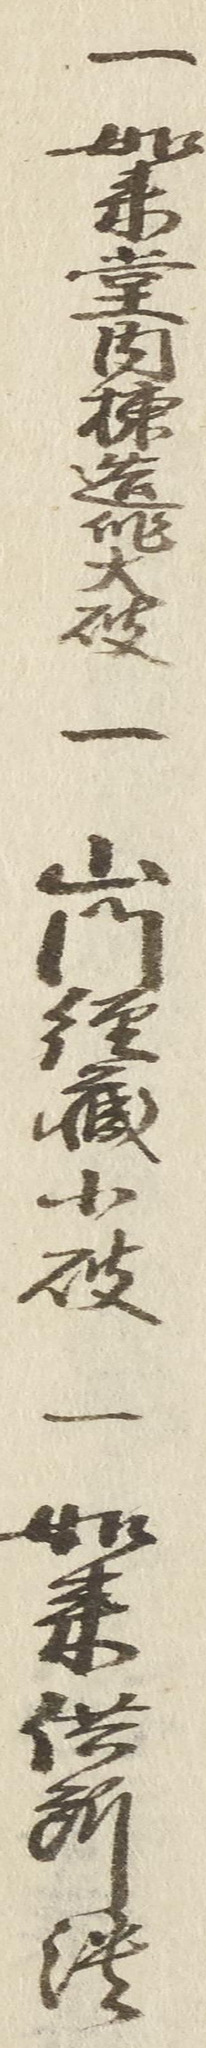一如来堂内棟造作大破一山門経蔵小破一如来供所潰
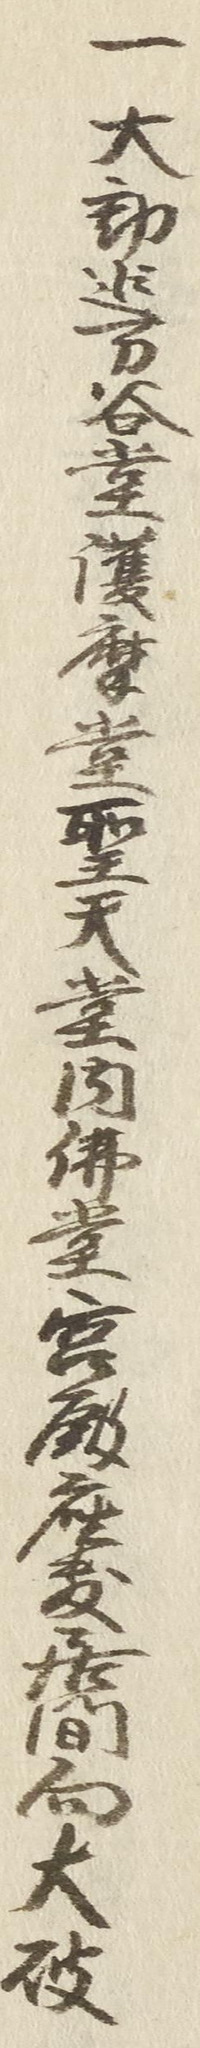一大勧進万谷堂護摩堂聖天堂内仏堂宮殿座敷居間向大破
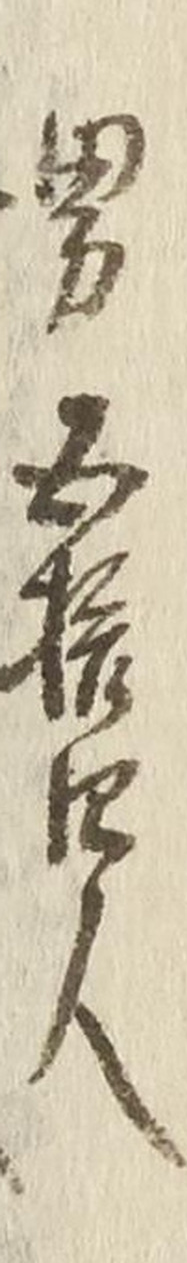男五拾四人
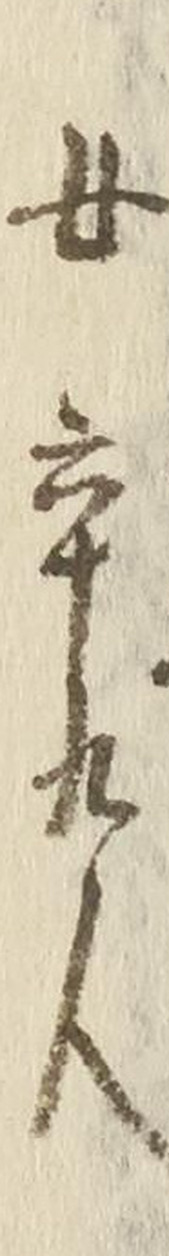女六十九人
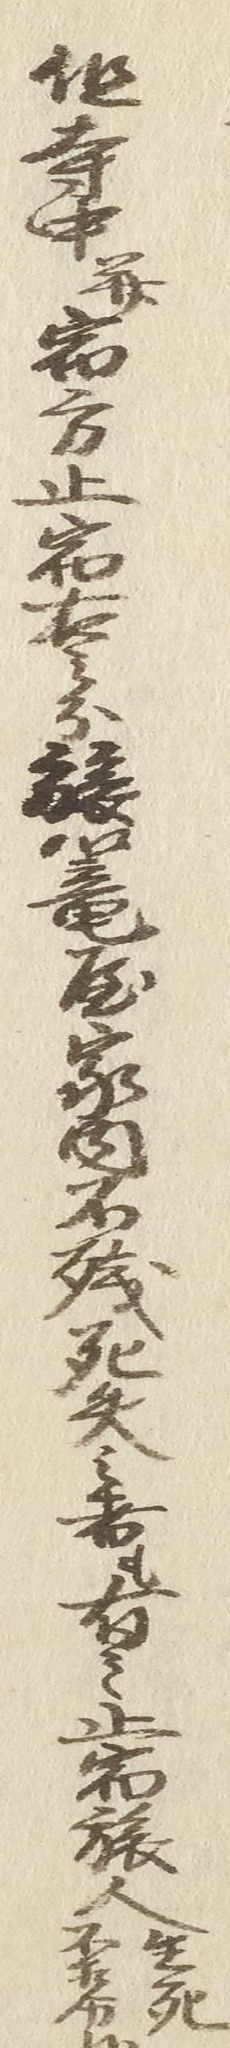但寺中并宿方止宿等之分旅篭屋家内不残死失之者も有之止宿旅人生死不相分候
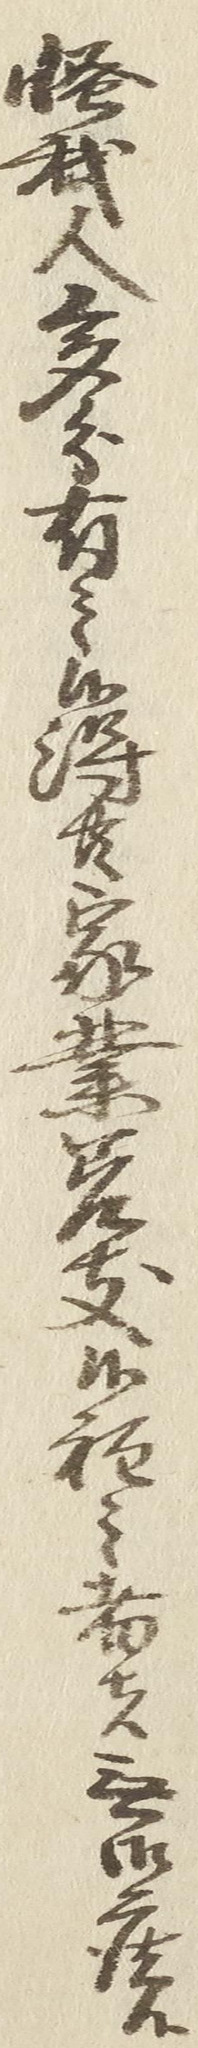怪我人多分有之候得共家業差支候程之者は無御座候
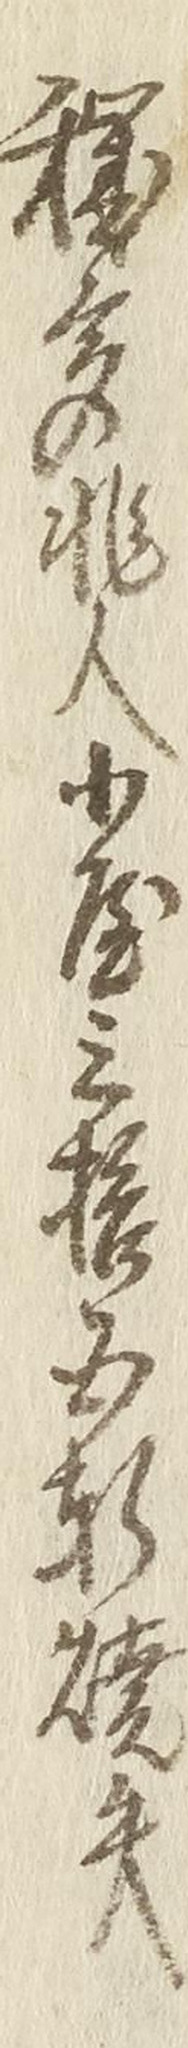穢多非人小屋三拾五軒焼失
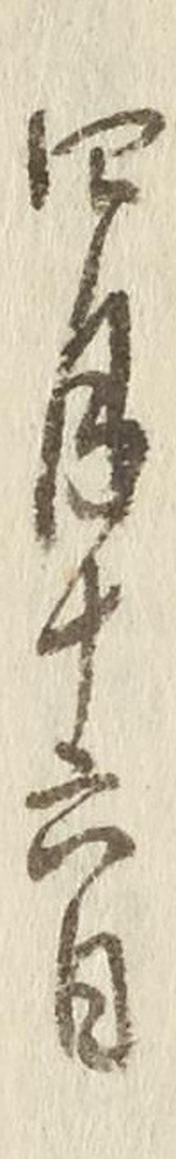四月十六日
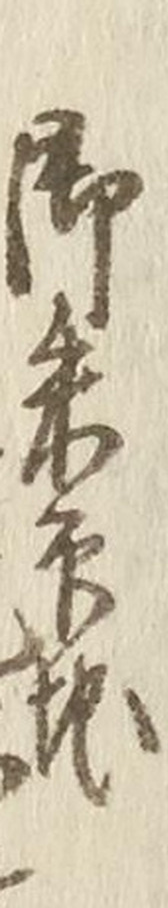御朱印地
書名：従往古地震御届書記誌之一
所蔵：東京大学地震研究所図書室 Earthquake Research Institute Library, The University of Tokyo, JAPAN
